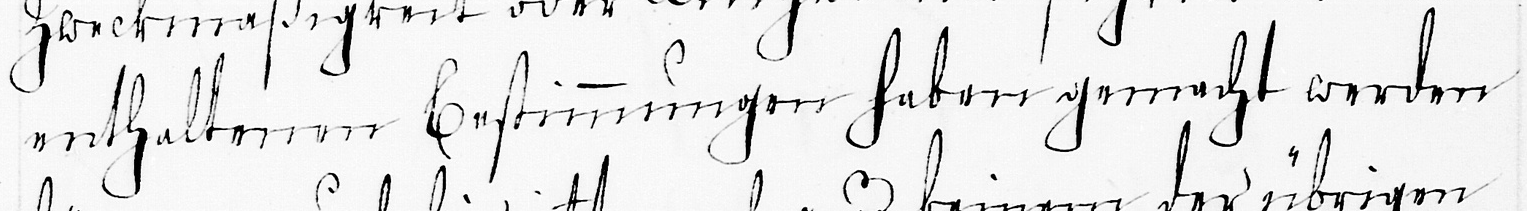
enthaltenen Bestimmungen haben gemacht werden
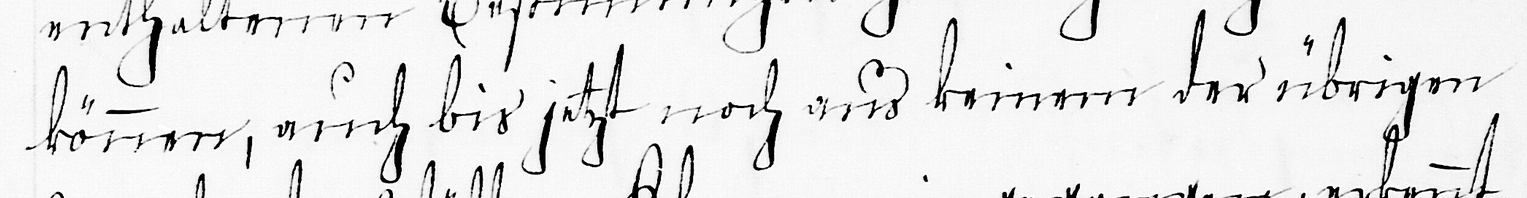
können, auch bis jetzt noch aus keinem der übrigen
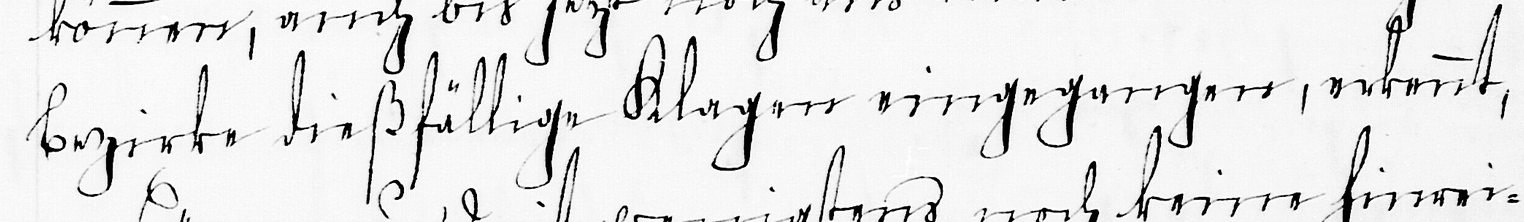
Bezirke dießfällige Klagen eingegangen, erkennt,
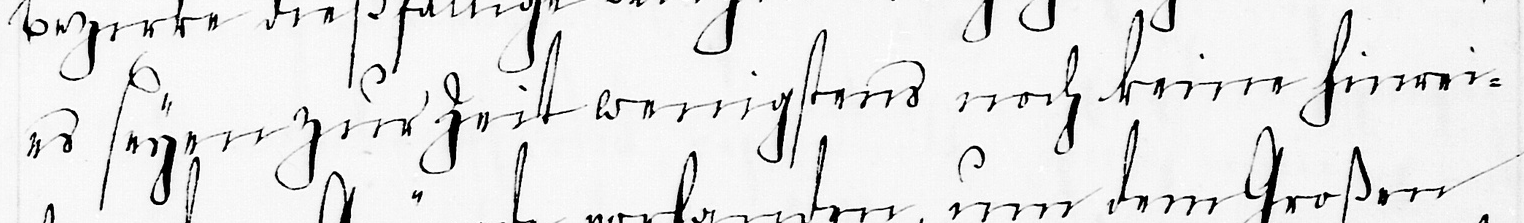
es seyen zur Zeit wenigstens noch keine hinrei¬
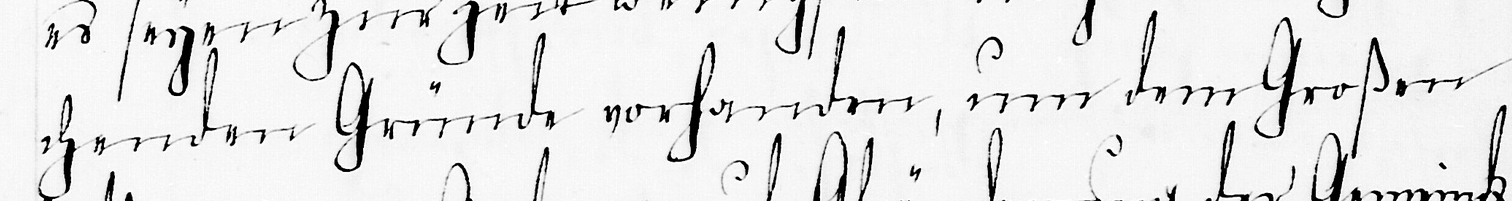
chenden Gründe vorhanden, um dem Großen
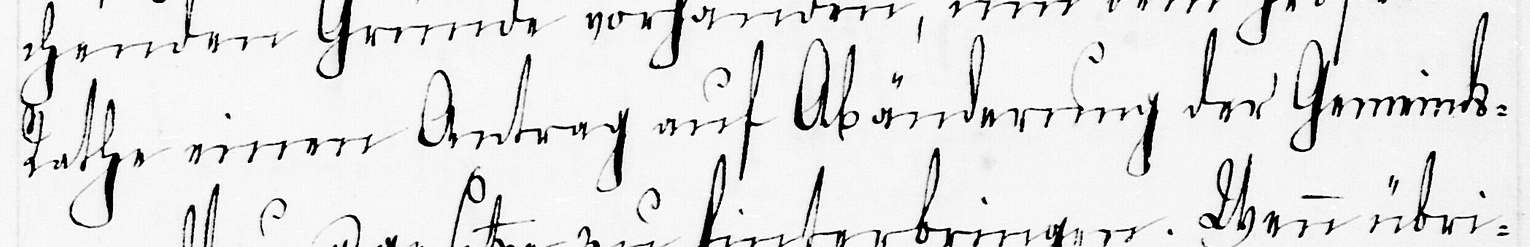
Rathe einen Antrag auf Abänderung der Gemeinds¬
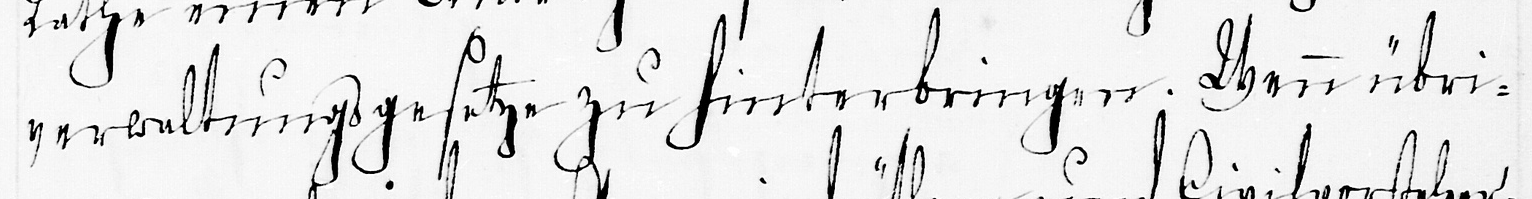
verwaltungsgesetze zu hinterbringen. Wenn übri¬
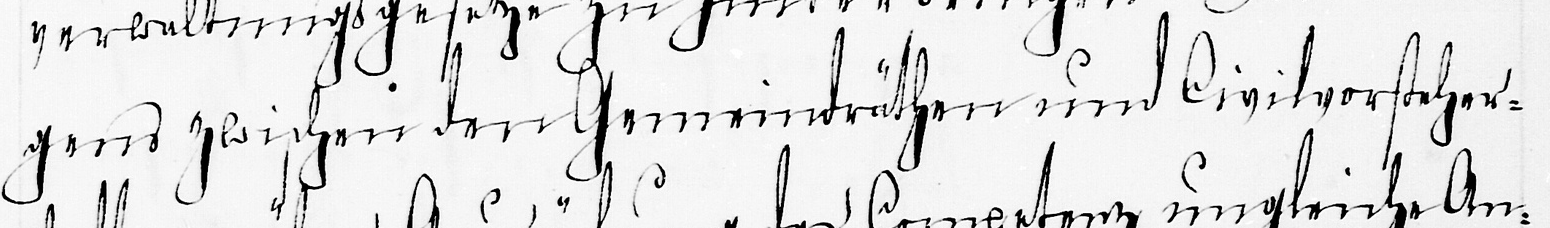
gens zwischen den Gemeindräthen und Civilvorsteher¬
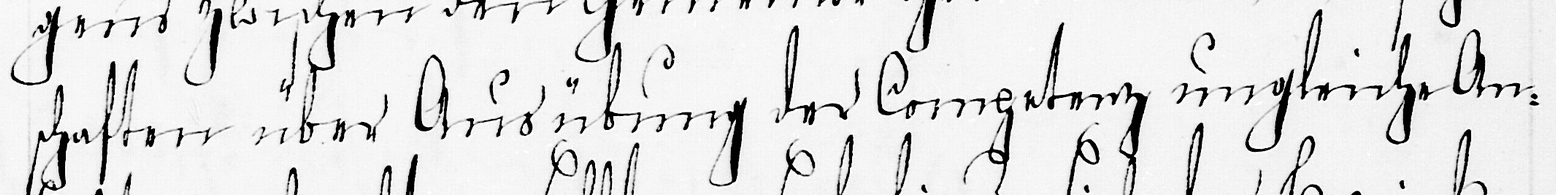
schaften über Ausübung der Competenz ungleiche An¬
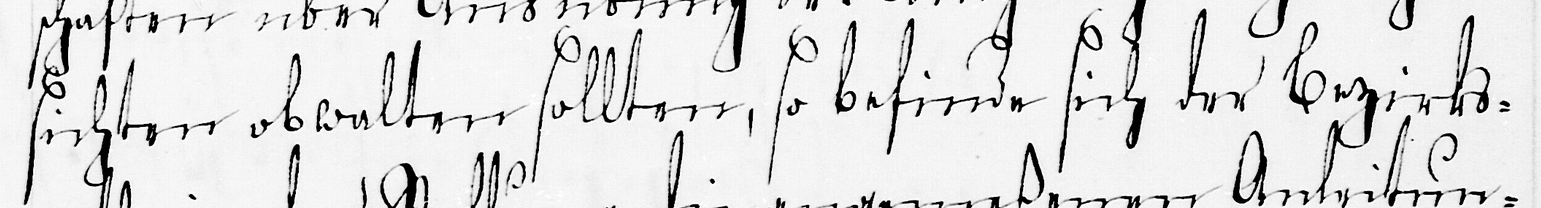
sichten obwalten sollten, so befinde sich der Bezirks¬
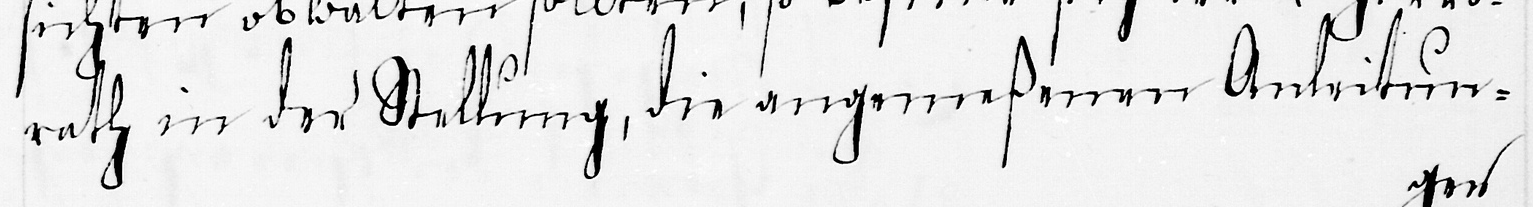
rath in der Stellung, die angemeßenen Anleitun-
